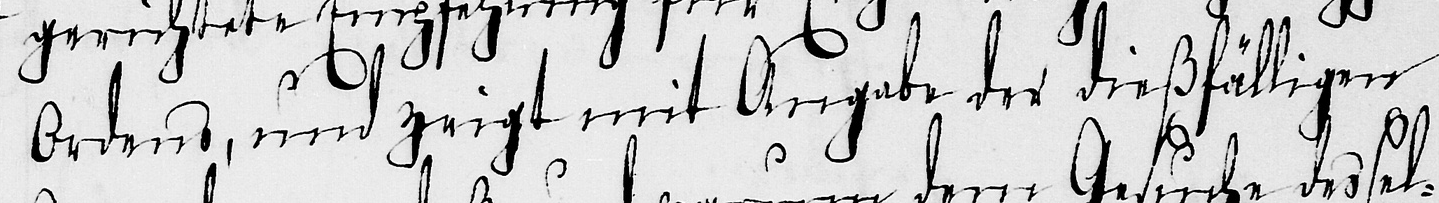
rdens und zeigt mit Angabe der dießfälligen
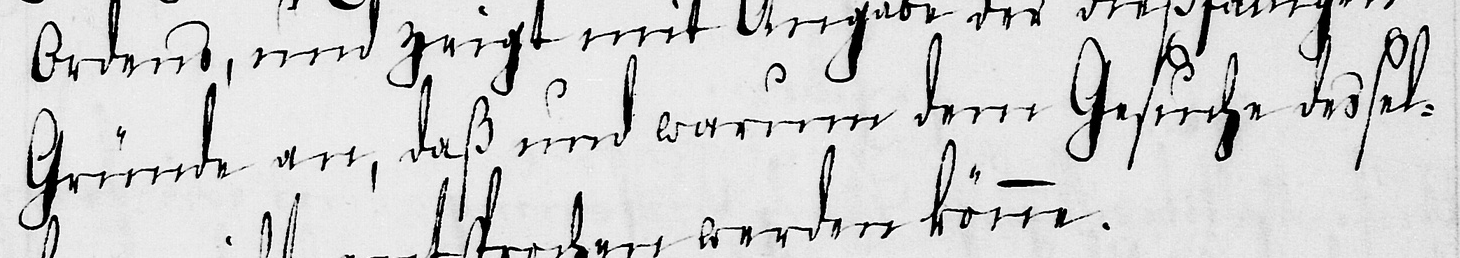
Gründe an, daß und warum dem Gesuche dessel¬
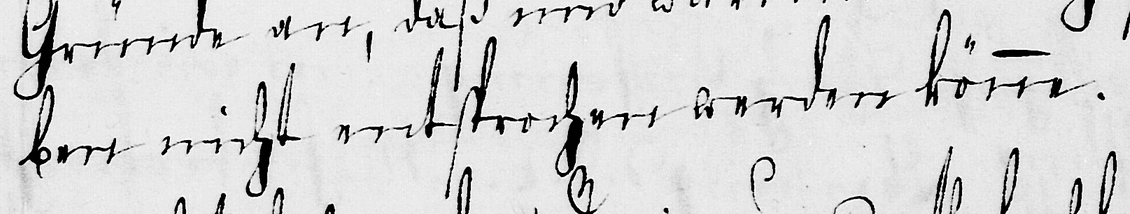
ben nicht entsprochen werden könne.
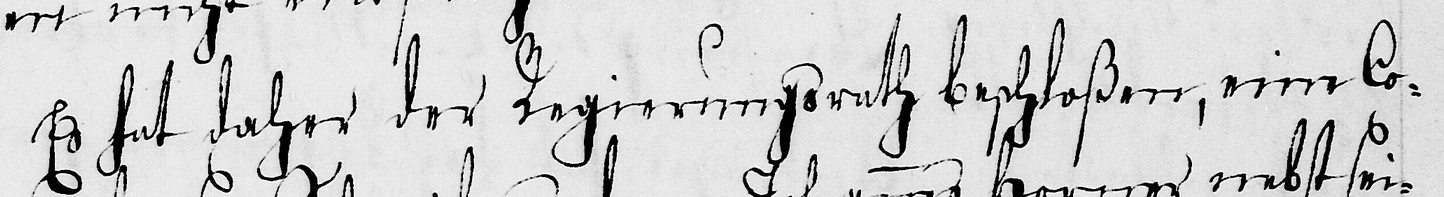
Es hat daher der Regierungsrath beschloßen, eine Co¬
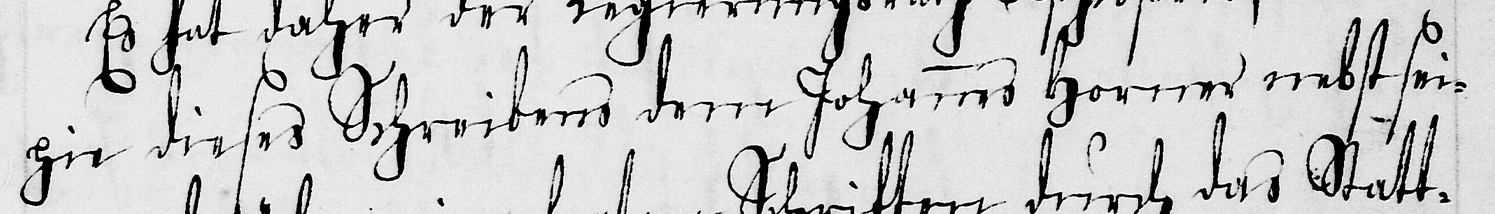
pie dieses Schreibens dem Johannes Horner nebst sei¬
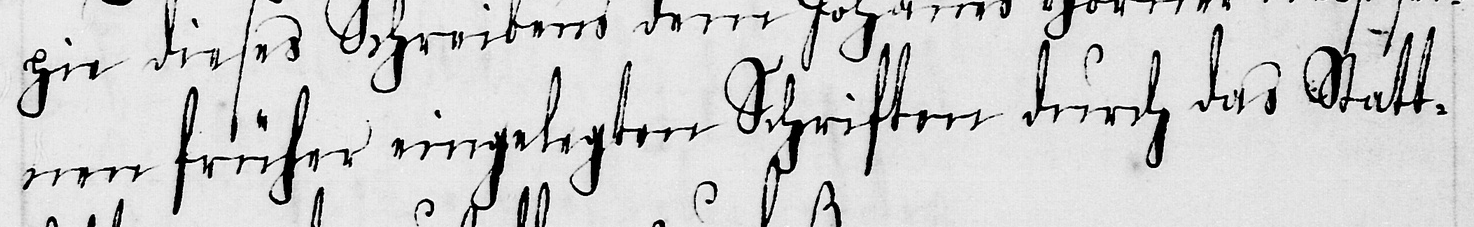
nen früher eingelegten Schriften durch das Statt¬
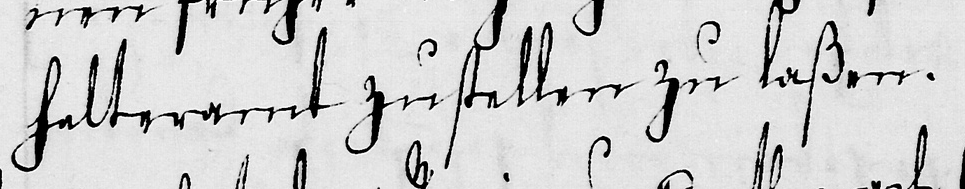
halteramt zustellen zu laßen.
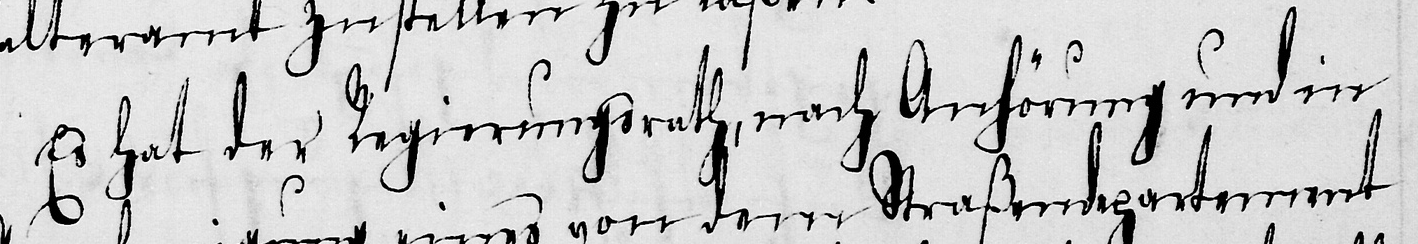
Es hat der Regierungsrath, nach Anhörung und in
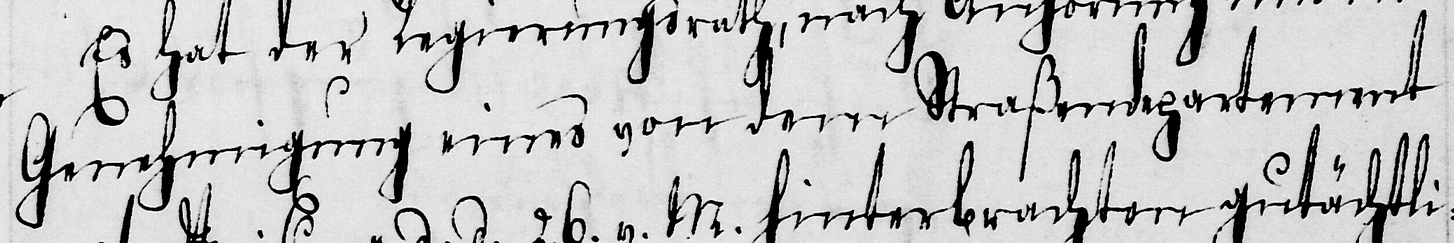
Genehmigung eines von dem Straßendepartement
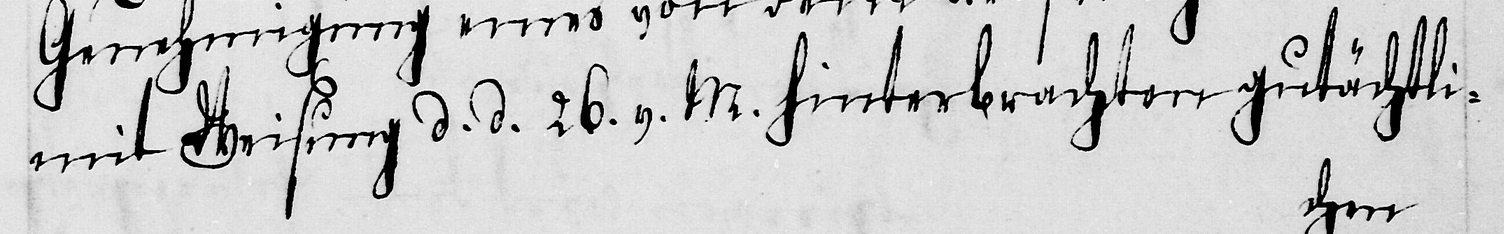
mit Weisung d. d. 26. v. M. hinterbrachten gutächtli-
